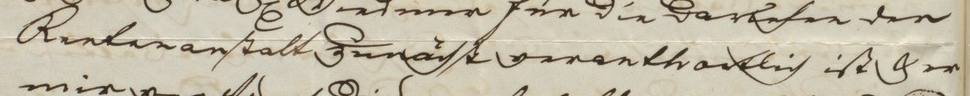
Rentenanstalt zunächst verantwortlich ist & er
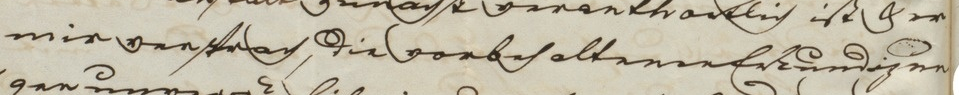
mir versprach, die vorbehaltenen Erkundigun-
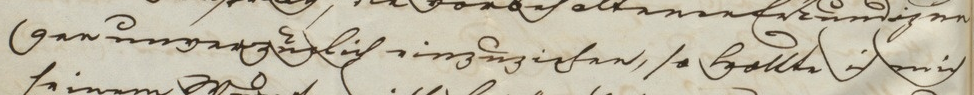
gen unverzüglich einzuziehen, so wollte ich mich
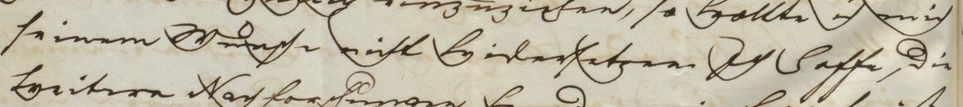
seinem Wunsche nicht widersetzen. Ich hoffe, die
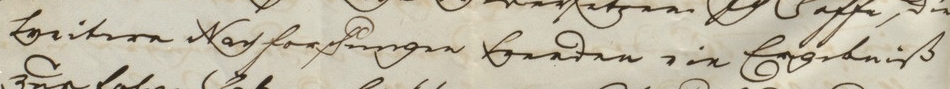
weitern Nachforschungen werden ein Ergebniß
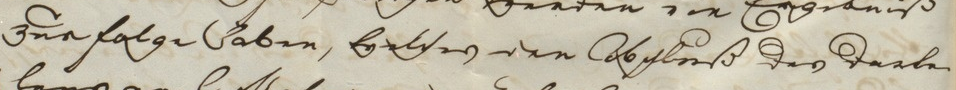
zur Folge haben, welches den Abschluss des Darle-
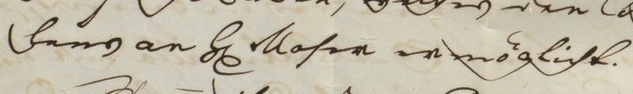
hens an Herr Moser ermöglicht.
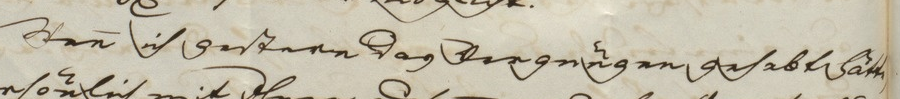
Wenn ich gestern das Vergnügen gehabt hätte,
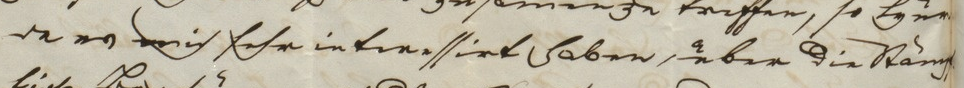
de es mich sehr interessirt haben, über die Stämpf -
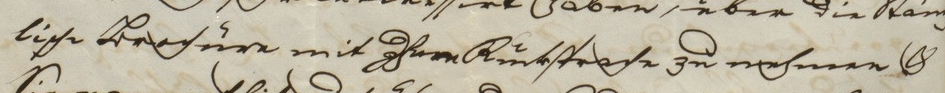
lische Broschüre mit Ihnen Rücksprache zu nehmen &
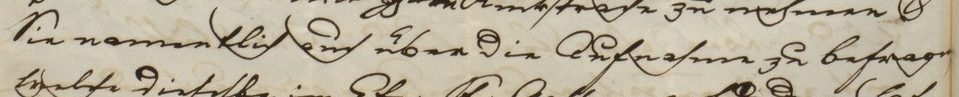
Sie namentlich auch über die Aufnahme zu befragen,
